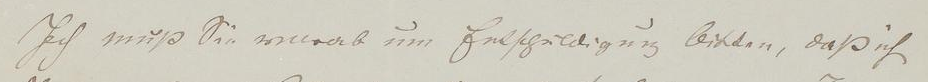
Ich muß Sie vorab um Entschuldigung bitten, daß ich
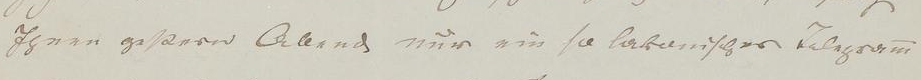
Ihnen gestern Abend nur ein so lakonisches Telegramm
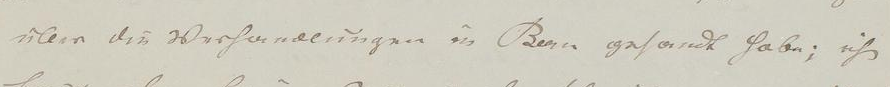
über die Verhandlungen in Bern gesandt habe; ich
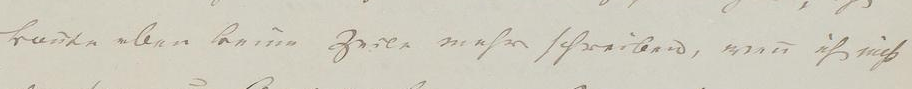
konnte aber keine Zeile mehr schreiben, wenn ich nicht
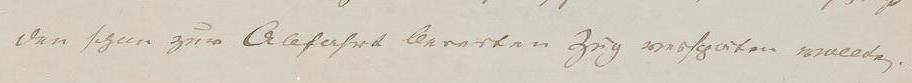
den schon zur Abfahrt bereiten Zug verspäten wollte.
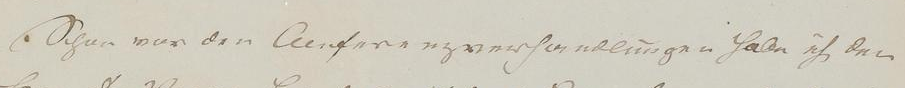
Schon vor den Conferenzverhandlungen habe ich den
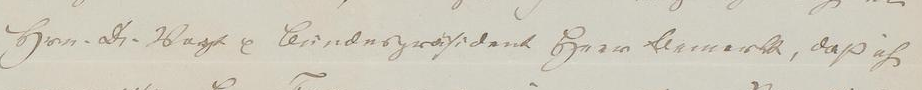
Hrn. Dr. Vogt u. Bundespräsident Heer bemerkt, daß ich
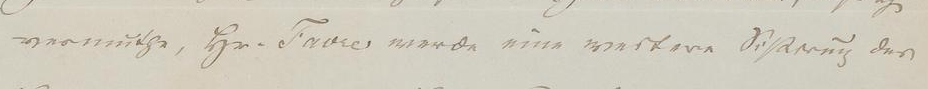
vermuthe, Hr. Favre werde eine weitere Sistirung des
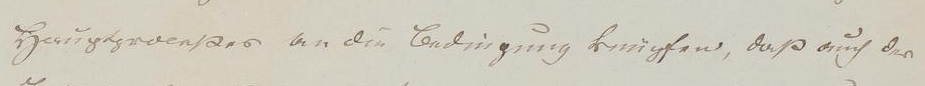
Hauptproceßes an die Bedingung knüpfen, daß auch der
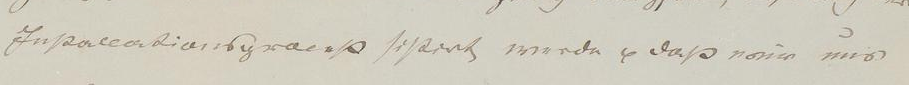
Installationsproceß sistirt werde u. daß wir uns
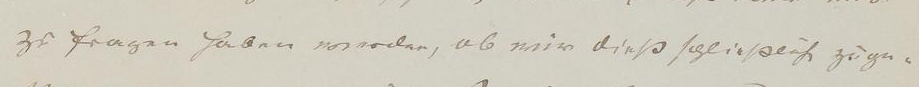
zu fragen haben werden, ob wir dieß schließlich zuge-
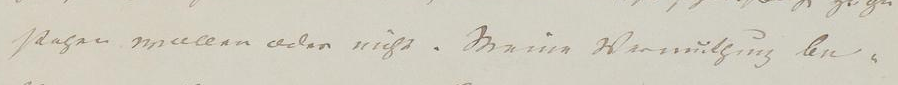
stehen wollen oder nicht. Meine Vermuthung be-
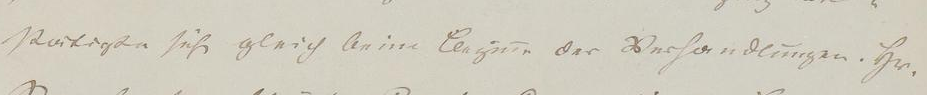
stätigte sich gleich beim Beginne der Verhandlungen. Hr.
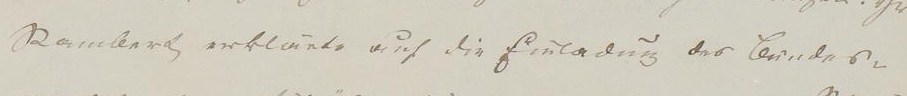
Rambert erklärte auf die Einladung des Bundes-
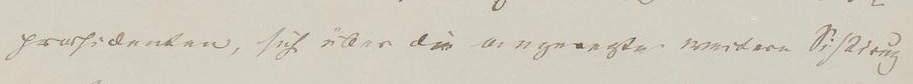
präsidenten, sich über die angeregte weitere Sistirung
